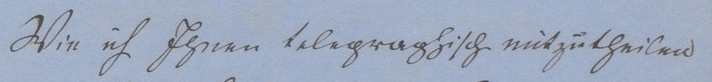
Wie ich Ihnen telegraphisch mitzutheilen
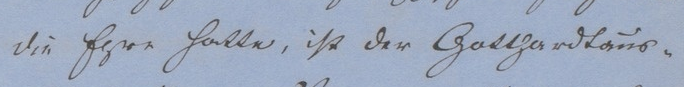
die Ehre hatte, ist der Gotthardtaus-
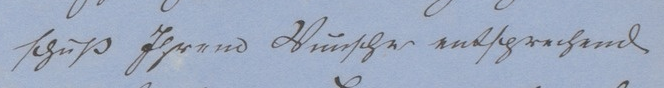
schuß Ihrem Wunsche entsprechend
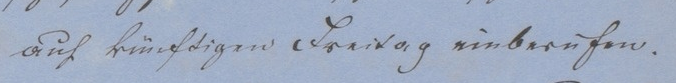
auf künftigen Freitag einberufen.
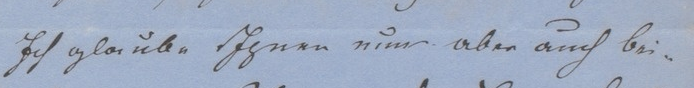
Ich glaube Ihnen nun aber auch bei-
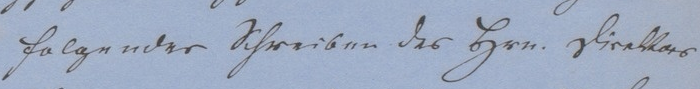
folgendes Schreiben des Hrn. Direktors
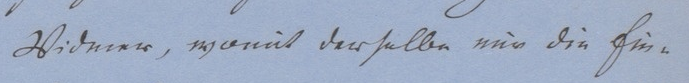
Widmer, womit derselben nur die Ein-
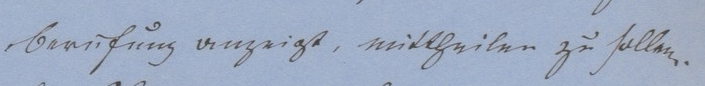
berufung anzeigt, mittheilen zu sollen.
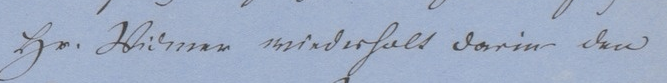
Hr. Widmer wiederholt darin den
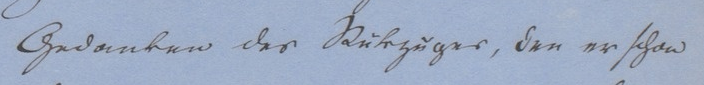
Gedanken des Rükzugees, den er schon
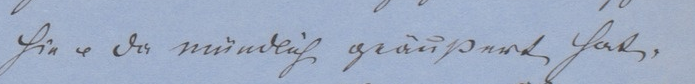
hie & da mündlich geäußert hat,
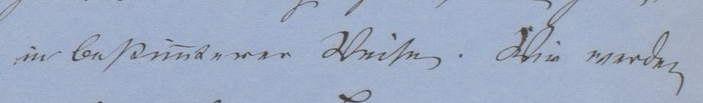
in bestimmterer Weise. Wir werden
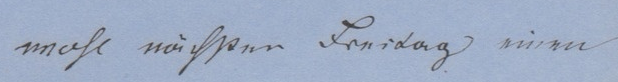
wohl nächsten Freitag einen
